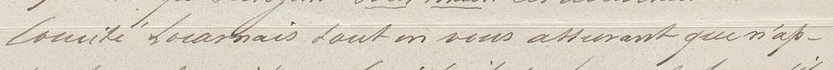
Comité Locarnais sont en vous assurant que n'ap-
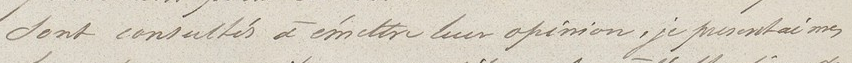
sont consultés à émettre leur opinion, je presentai mes
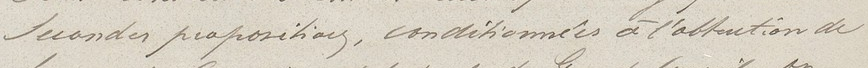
secondes propositions, conditionnées à l'obstruction de
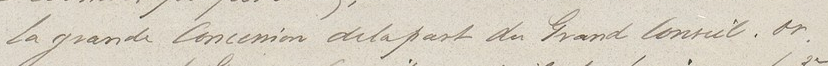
la grande Concession dela part du Grand Conseil. Or
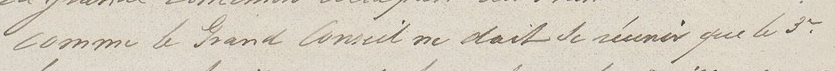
comme le Grand Conseil ne doit se réunir que le 3e
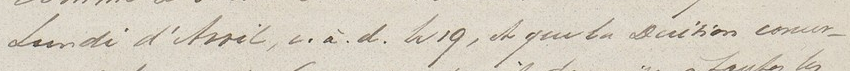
Lundi d'Avril, c. à d. le 19, et que la Decision concer-
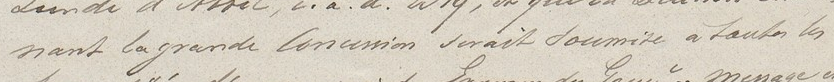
nant la grande Concession serait soumise à toutes les
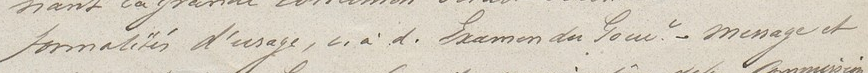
formalités d'usage, c. à d. Examen du Gouvt – message et
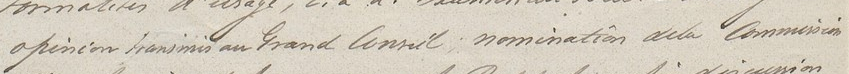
opinion transmis au Grand Conseil; nomination dela Commission
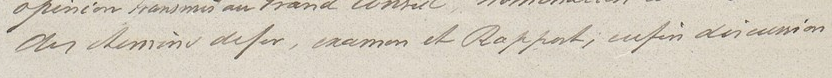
des chemins de fer, examen et Rapport; enfin discussion
